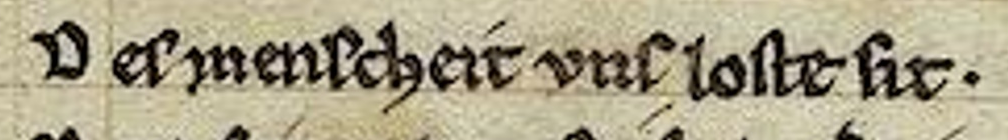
Deſ menſcheit vnſ loſte ſit.
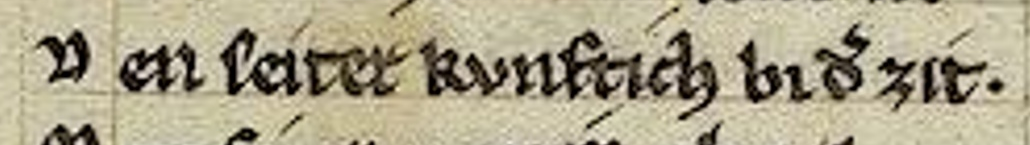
Den ſeiter kvnftich bi d(er) zit.
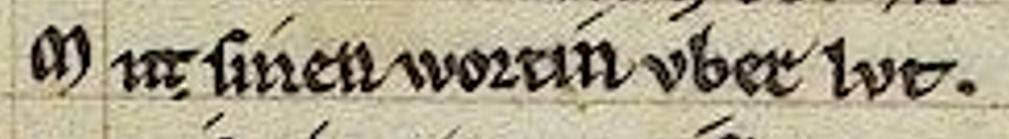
Mit ſinen wortin vber lvt.
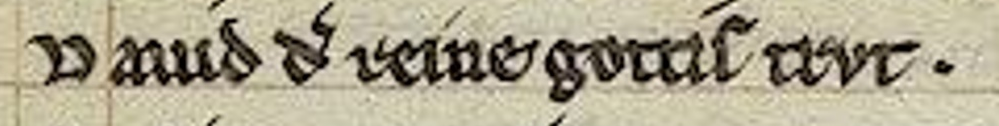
Dauid d(er) reine gottiſ trvt.
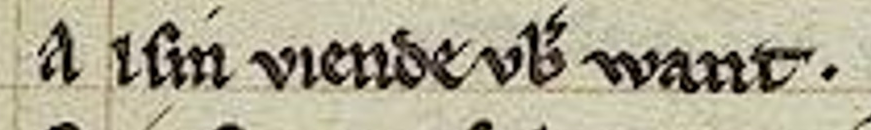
Al ſin viende vb(er) want.
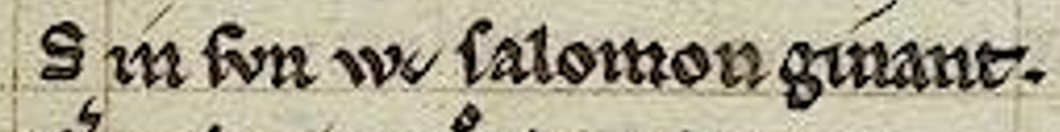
Sin ſvn w(az) ſalomon ginant.
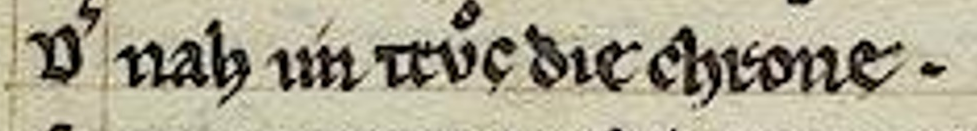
D(er) nah im trv°oc die chrone.
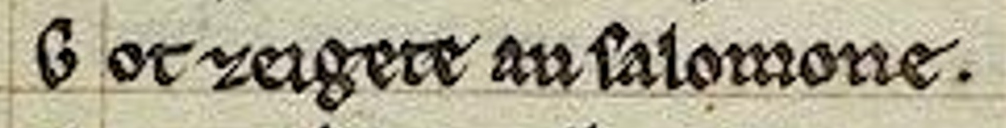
Got zeigete an ſalomone.
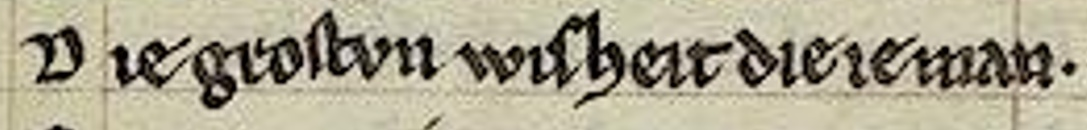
Die groſtvn wiſheit die ieman.
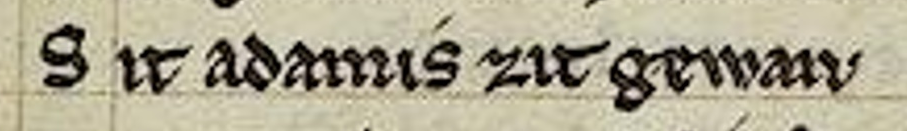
Sit adamis zit gewan.
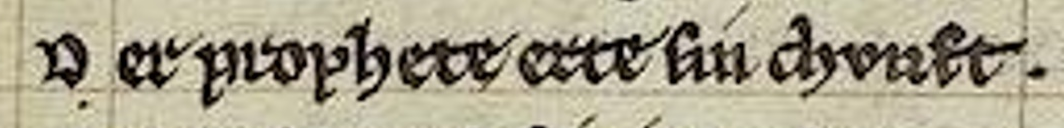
Der prophete erte ſin chvnſt.
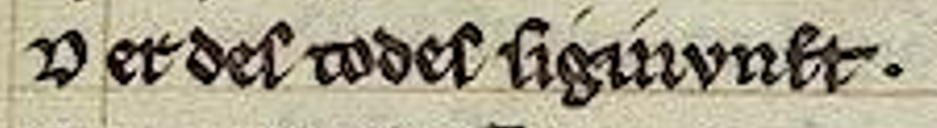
Der deſ todeſ ſiginvnft.
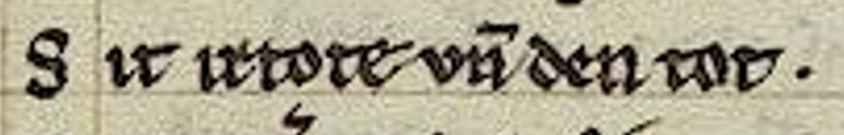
Sit irtote vn(d) den tot.
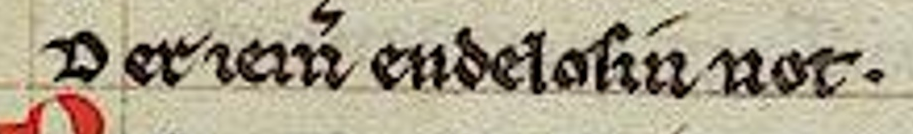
Der iem(er) endeloſin not.
